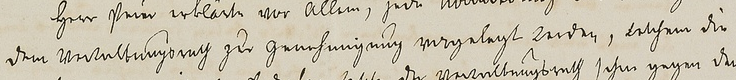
dem Verwaltungsrath zur Genehmigung vorgelegt werden, welchem die
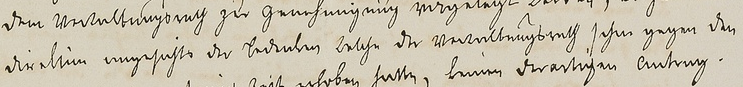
Direktion angesichts der Bedenken welche der Verwaltungsrath schon gegen den
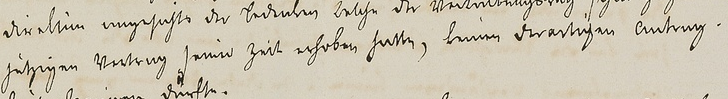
jetzigen Vertrag seiner Zeit erhoben hatte, keinen derartigen Antrag
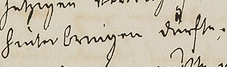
hinterbringen dürfte.
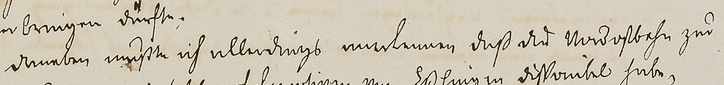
Daneben mußte ich allerdings anerkennen daß die Nordostbahn zur
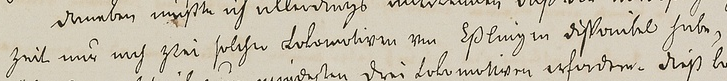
Zeit nur noch zwei solche Lokomotiven von Eßlingen disponibel habe,
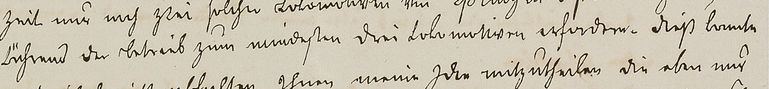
während der Betrieb zum mindesten drei Lokomotiven erfordere. Dieß konnte
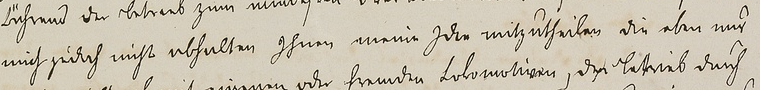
mich jedoch nicht abhalten Ihnen meine Idee mitzutheilen die eben nur
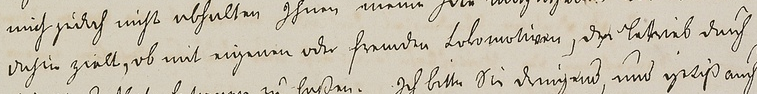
dahin zielt, ob mit eigenen oder fremden Lokomotiven, den Betrieb durch
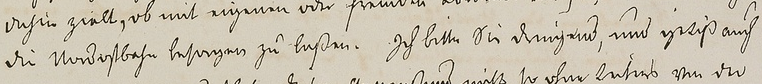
die Nordostbahn besorgen zu laßen. Ich bitte Sie dringend, und gewiß auch
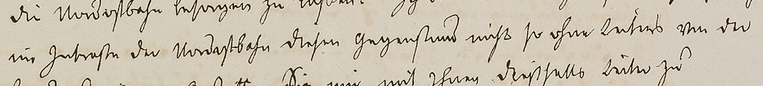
im Intreße der Nordostbahn diesen Gegenstand nicht so ohne weiters von der
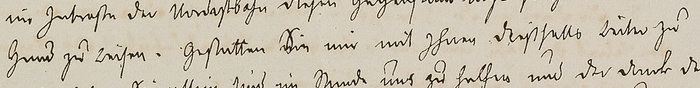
Hand zu weisen. Gestatten Sie mir mit Ihnen dießfalls weiter zu
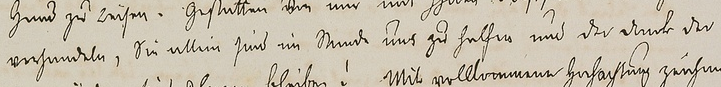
verhandeln, Sie allein sind im Stande uns zu helfen und der Dank der
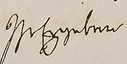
Ihr Ergebner
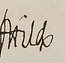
Wild
